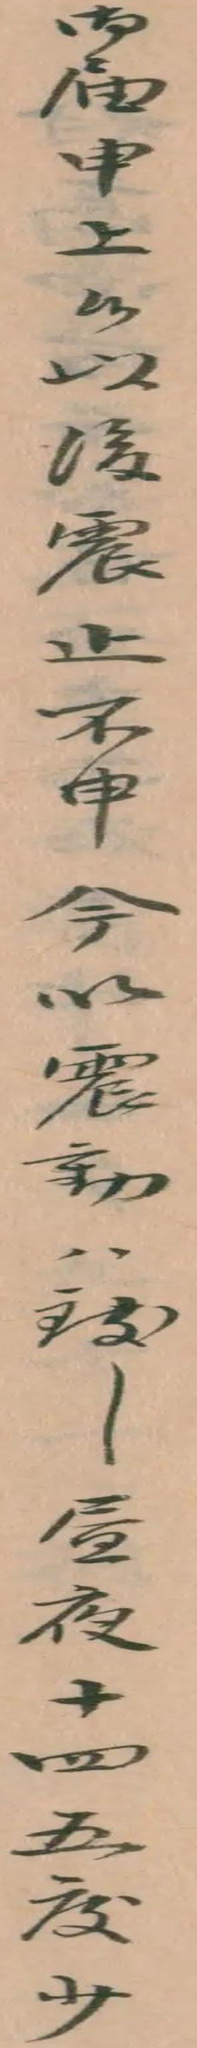御届申上候以後震止不申今以震動ハ致し昼夜十四五度少
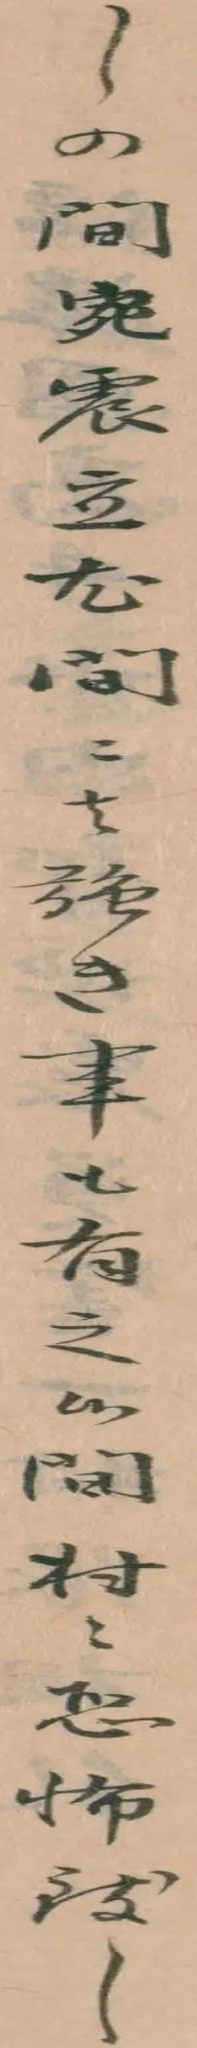しの間宛震立尤間々者強き事も有之候間村々恐怖致し
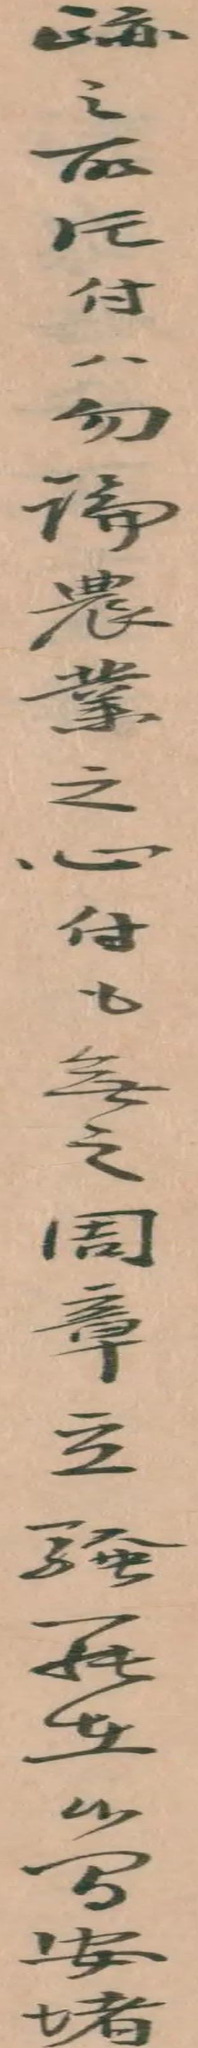跡の取所片付ハ勿論農業之心付も無之周章立騒罷在候間堵
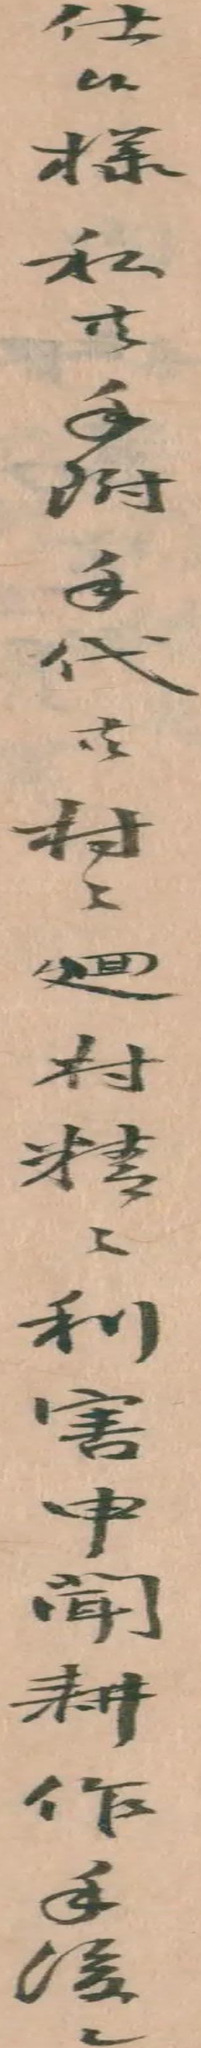仕候様私并手附手代共村々廻村精々利害申聞耕作手後レ
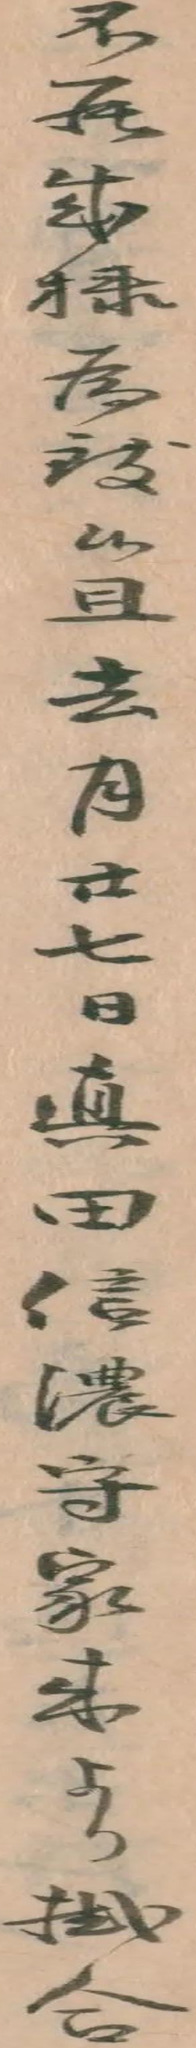不罷成様為致候且去月廿七日真田信濃守家来ゟ掛合
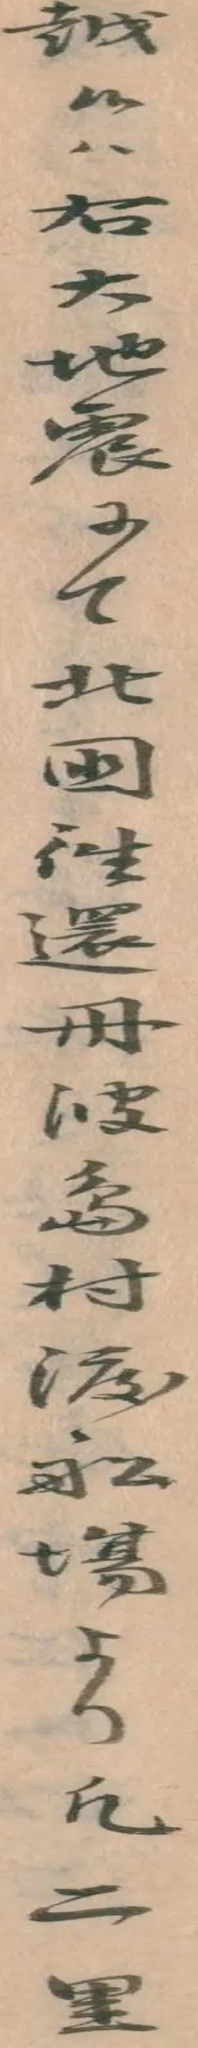越候ハ右地震にて北国往還丹波島村渡船場より凡二里
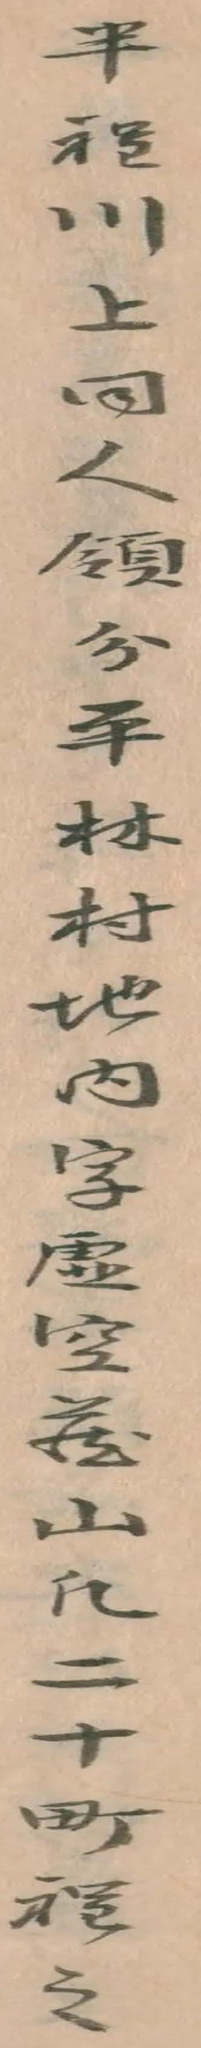半程川上同人領分平林村地内字虚空蔵山凡二十町程之
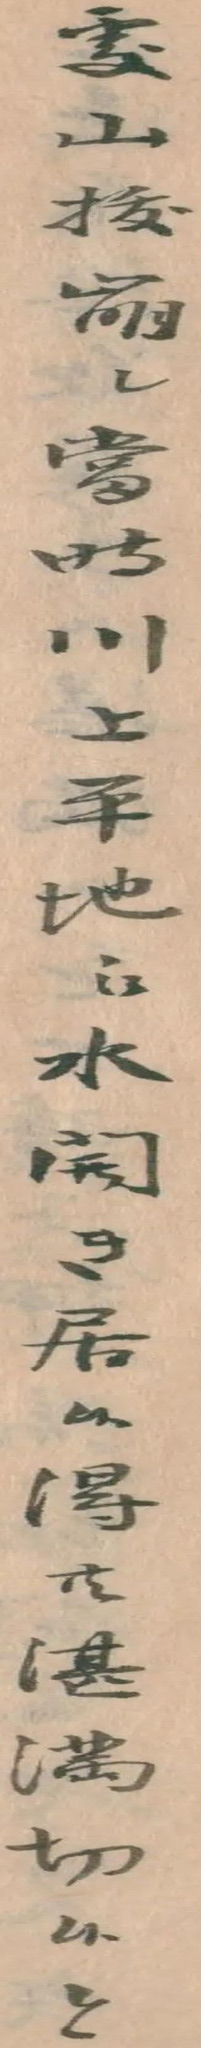処山抜崩レ当時川上平地江水開き居候得共湛溜切候と
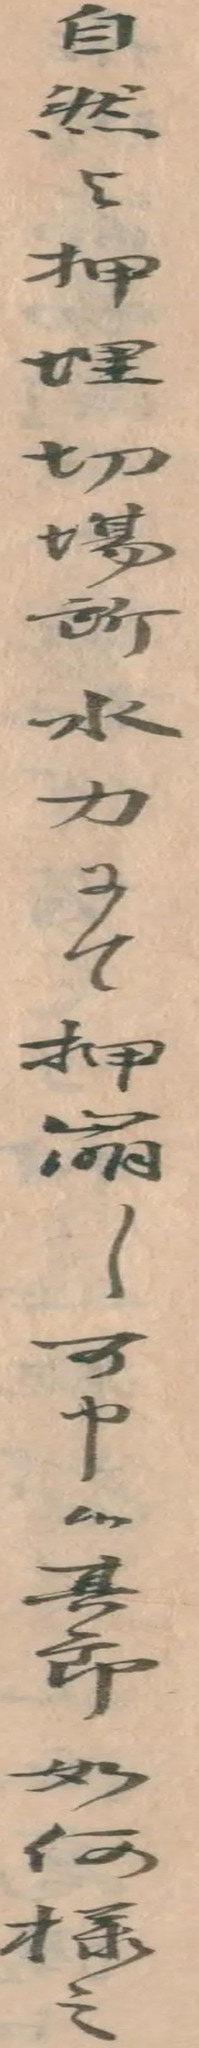自然と押埋切場所水力にて押崩し可申候其節如何様之
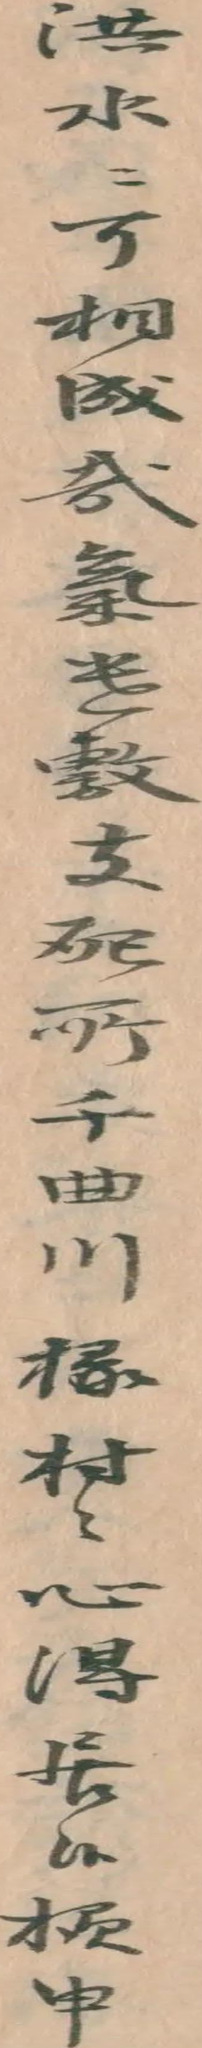洪水二可相成哉気遣敷支配所千曲川縁村々心得置候様申

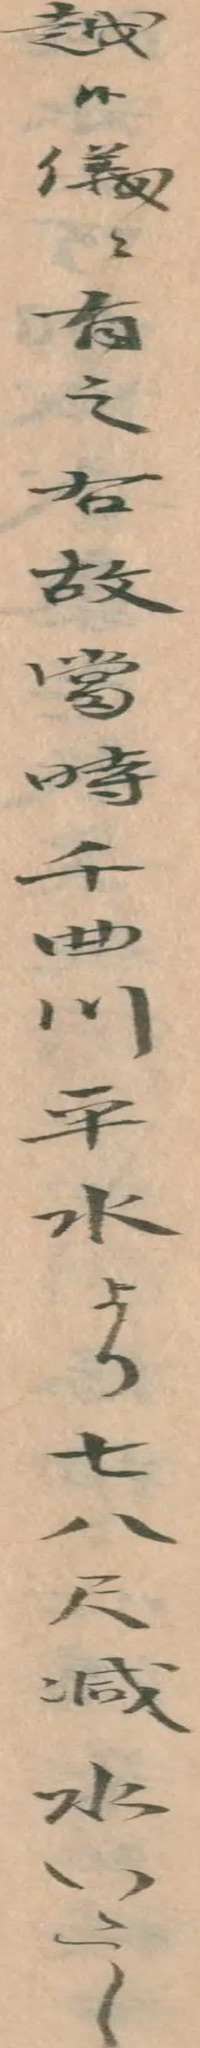越候儀二有之右故当時千曲川平水ゟ七八尺減水いたし
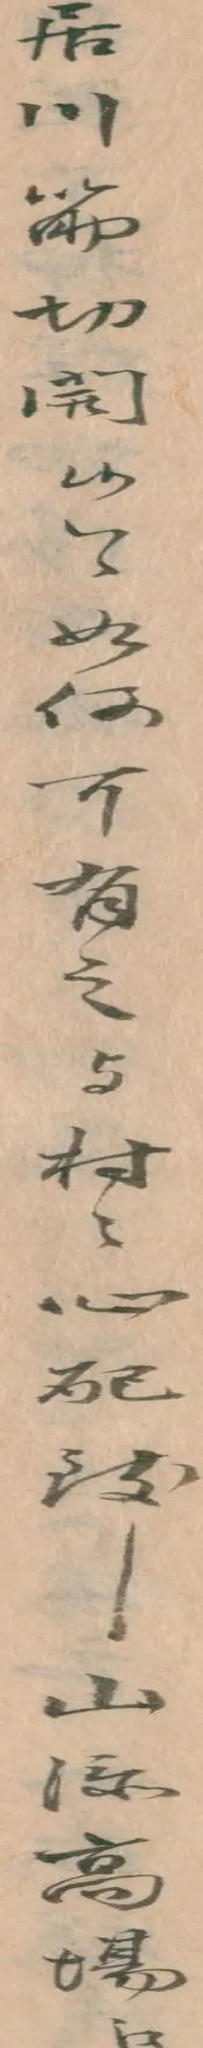居川筋切開候ハゝ如何可有之と村々心配致し山添高場江
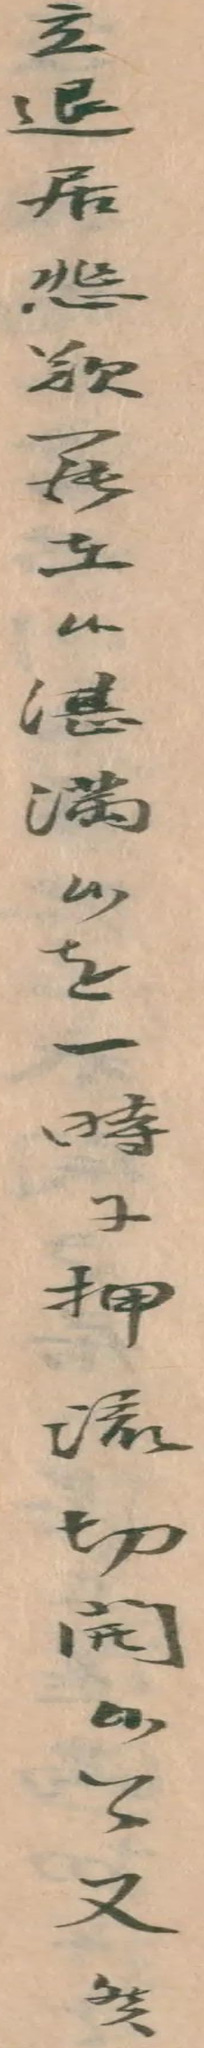立退居悲歎罷在候湛満を一時二押流切開候ハヽ又候
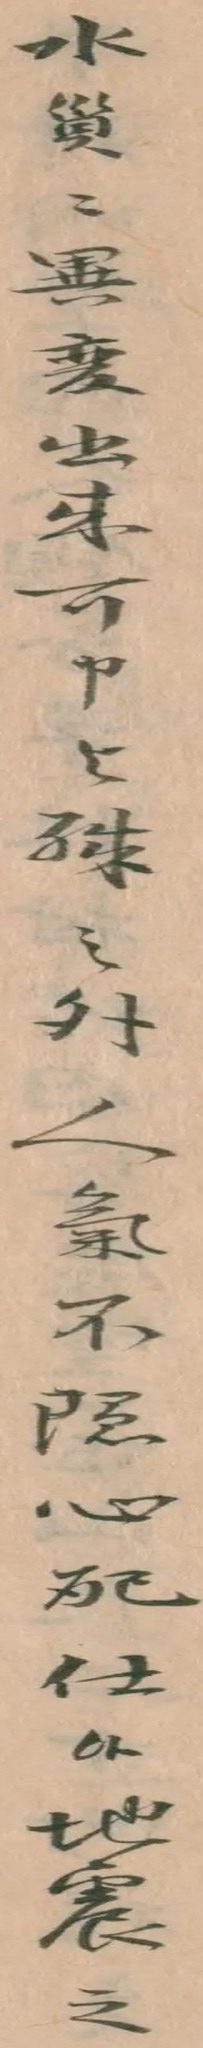水災二異変又出来可申と殊之外人気不穏心配仕候地震之
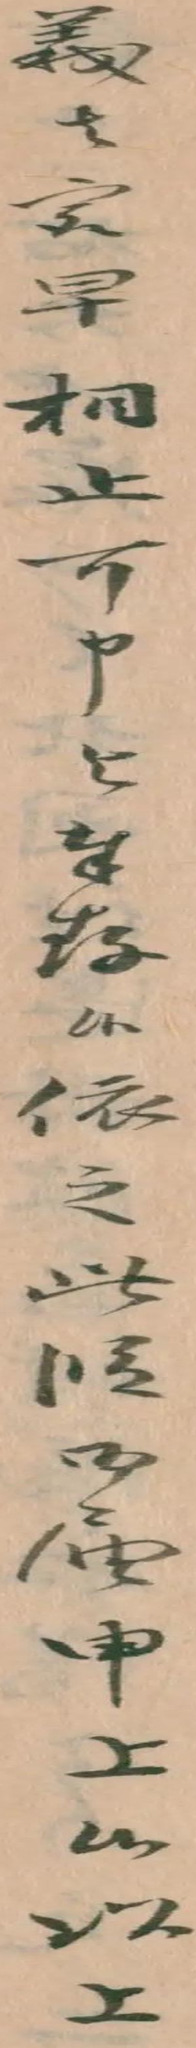儀は最早相止可申と奉存候依之此段御届申上候以上
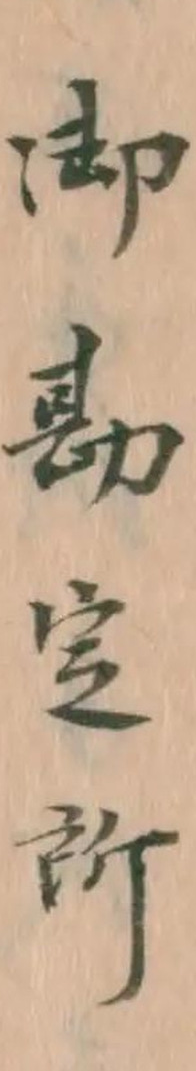御勘定所
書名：地災撮要. 巻3(地震之部)-巻4(噴火之部)
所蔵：国立国会図書館 National Diet Library, JAPAN
